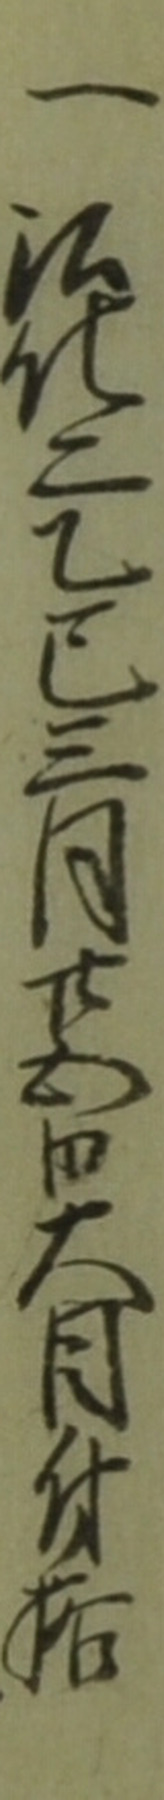一弘化二乙巳三月廿五日大目付格
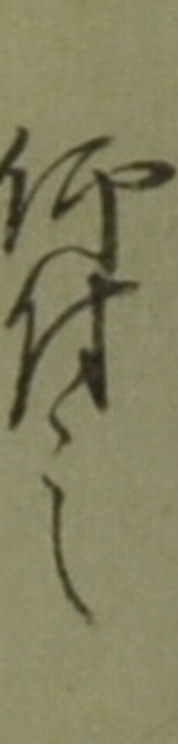仰付之
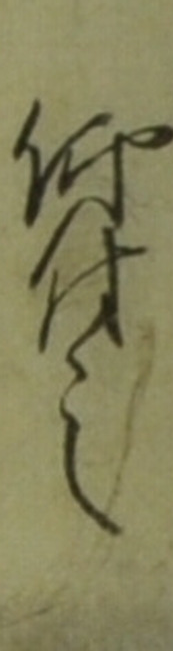仰付之

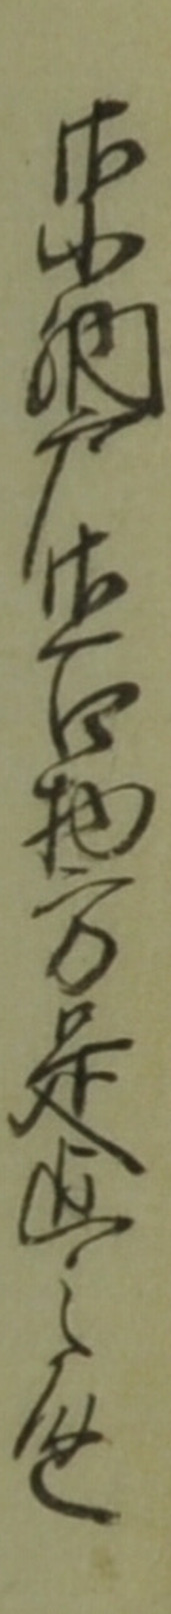御小納戸御召物方是迄之通
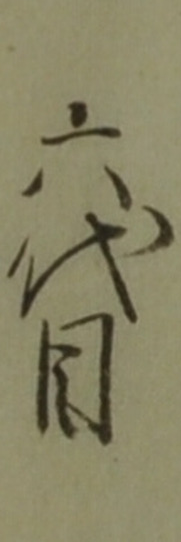六代目
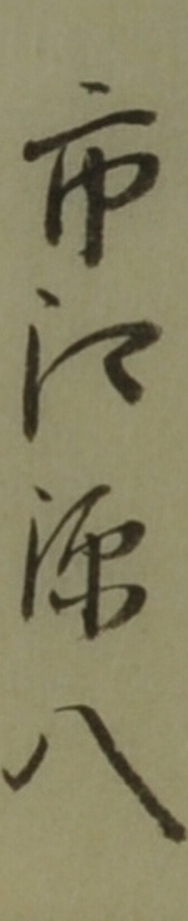市江源八
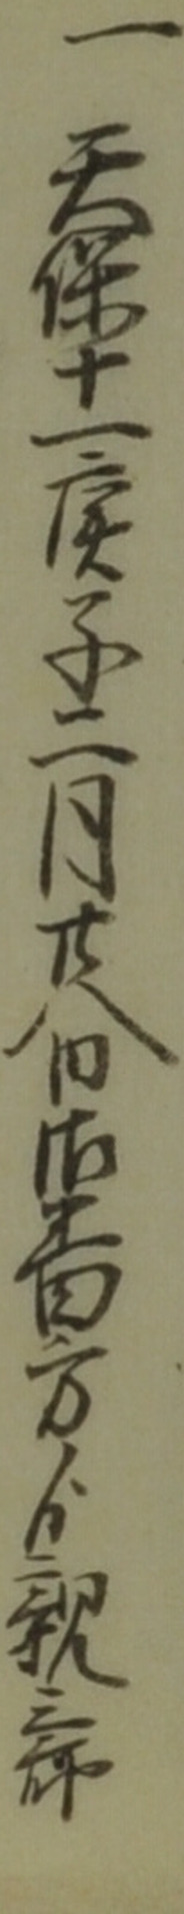一天保十一庚子二月廿八日御番方ゟ親三郎
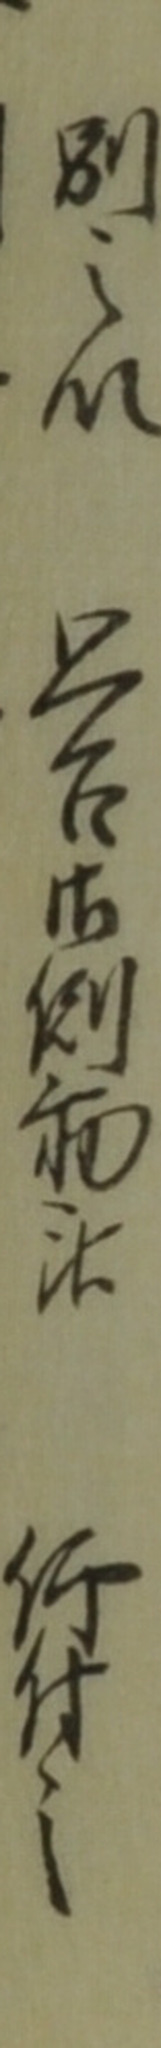別之以御思召御側勤被御仰付之
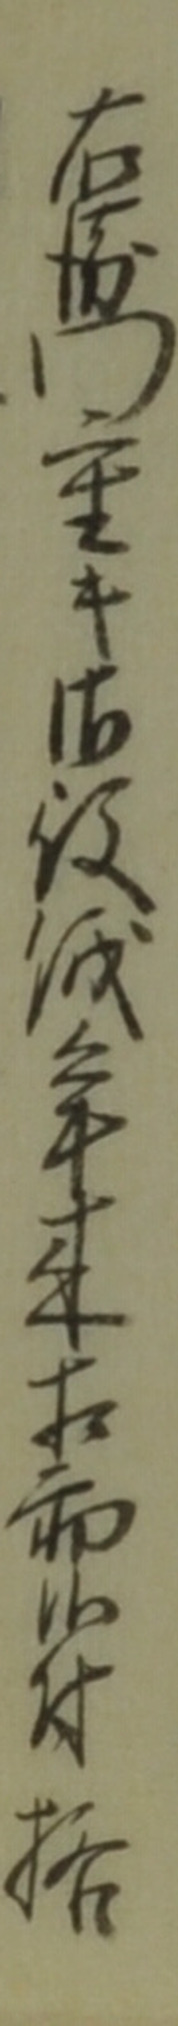右衛門重キ御仮役儀年来相勤候付格
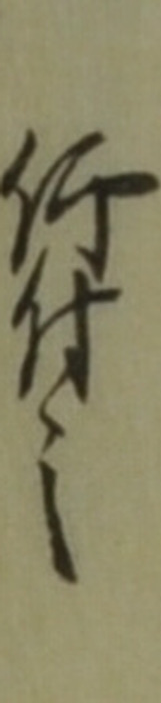仰付之
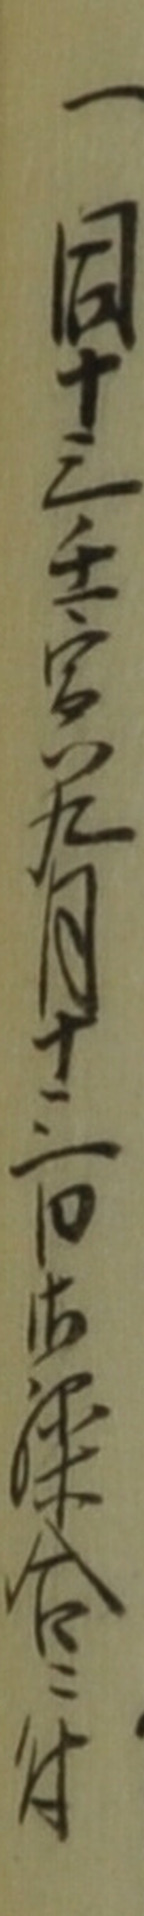一同十三壬寅九月十三日御繰合ニ付
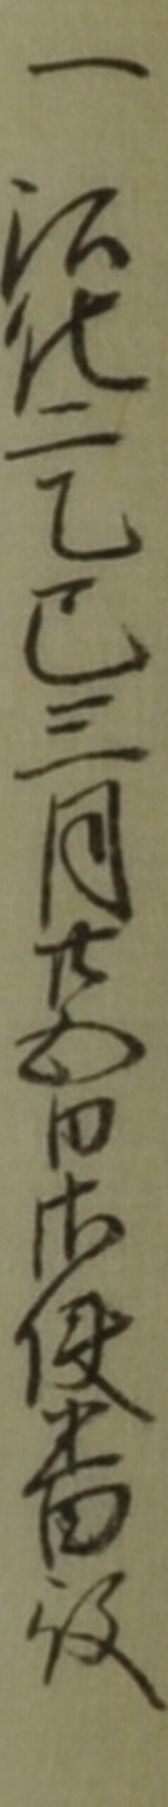一弘化二乙巳三月廿五日御使番役
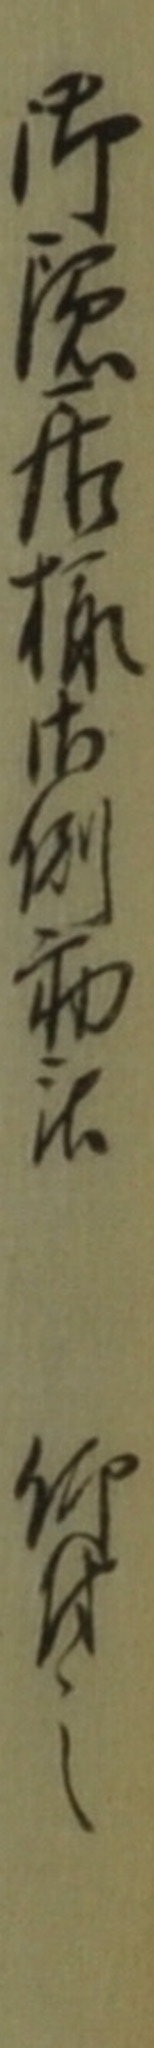御隠居様御側勤被仰付之
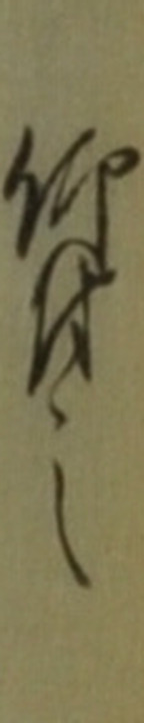仰付之
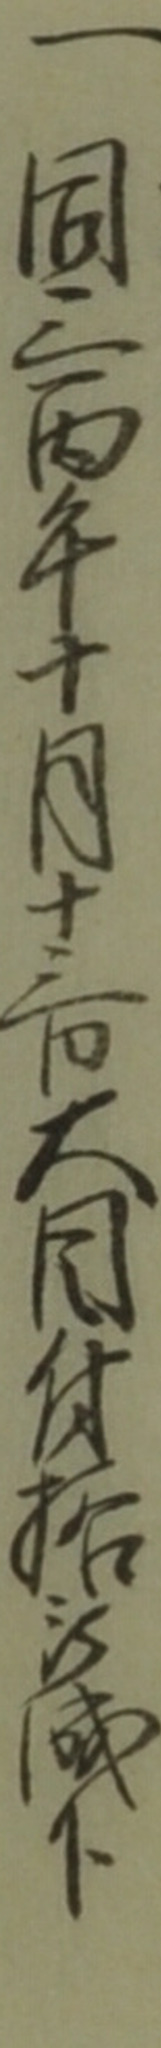一同三丙午十月十三日大目付格被成下
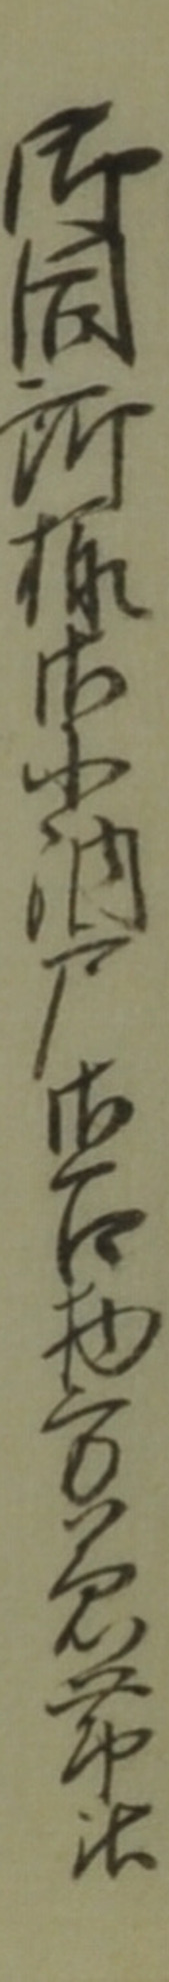御同所御小納戸御召物方兼帯被
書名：諸御役代々録（五）
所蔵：伊那市立高遠町図書館・合同会社AMANE
